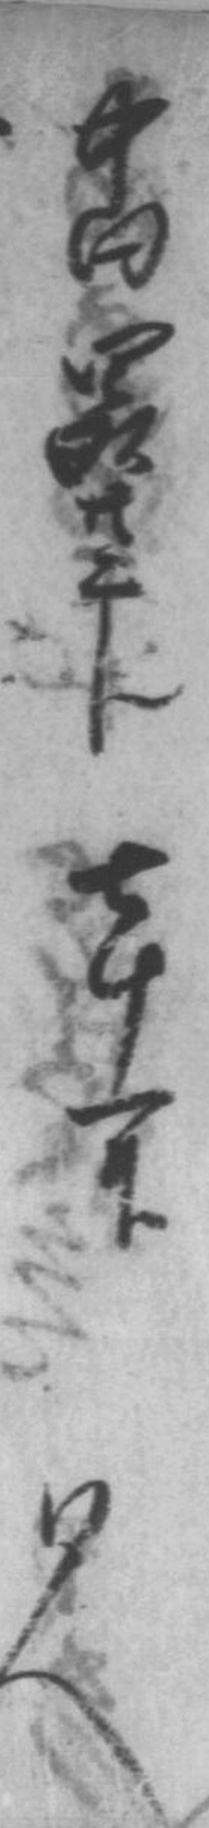中田四畝廿二分七斗一升同人
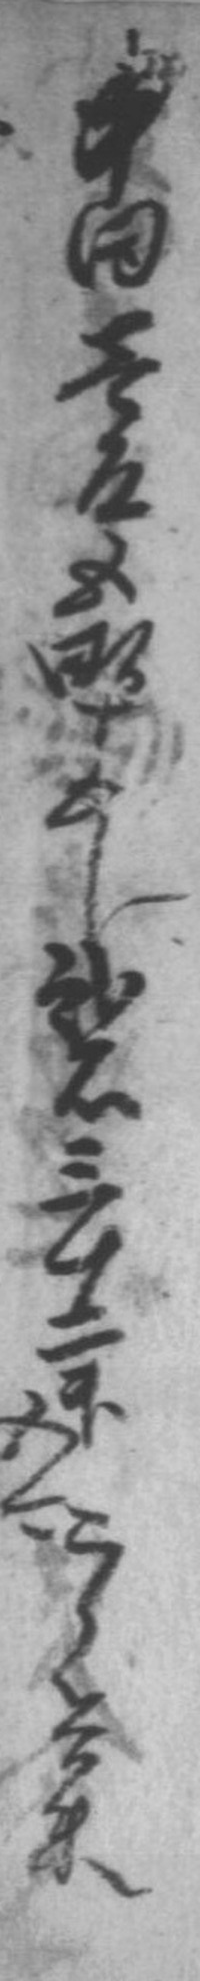中田壱反五畝十五分弐石三斗二升五合二郎兵衛
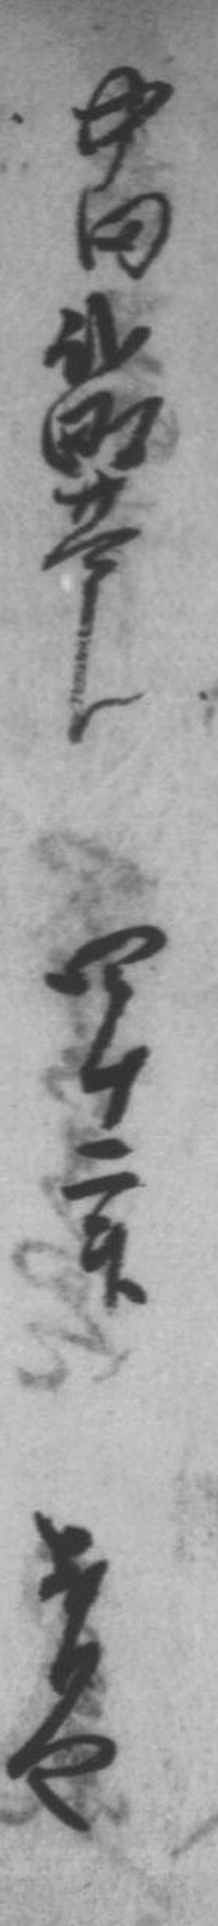中田弐畝廿四分四斗二升おりや

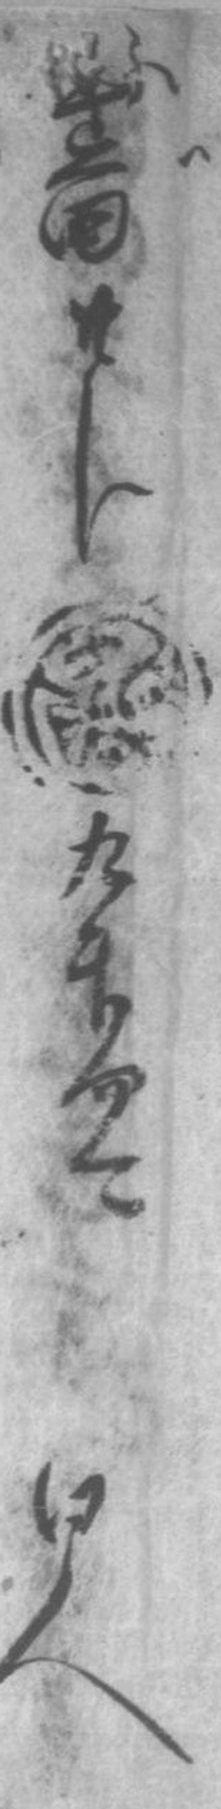荒田廿分㊞九升四合同人
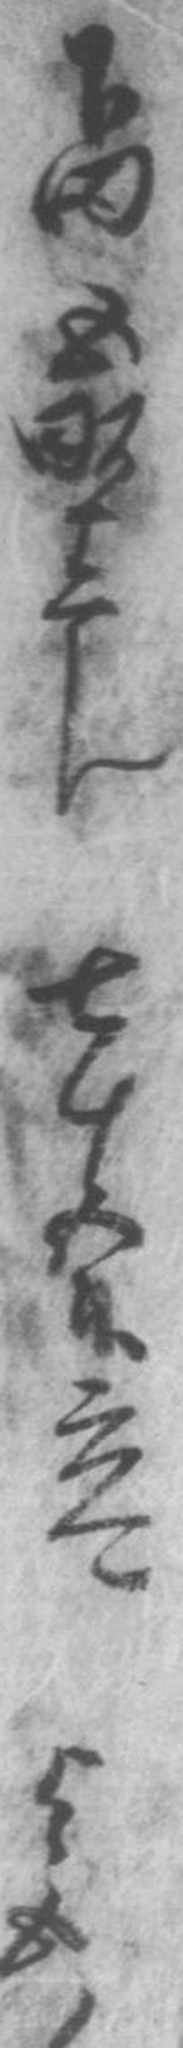下田五畝十二分七斗五升六合与五郎
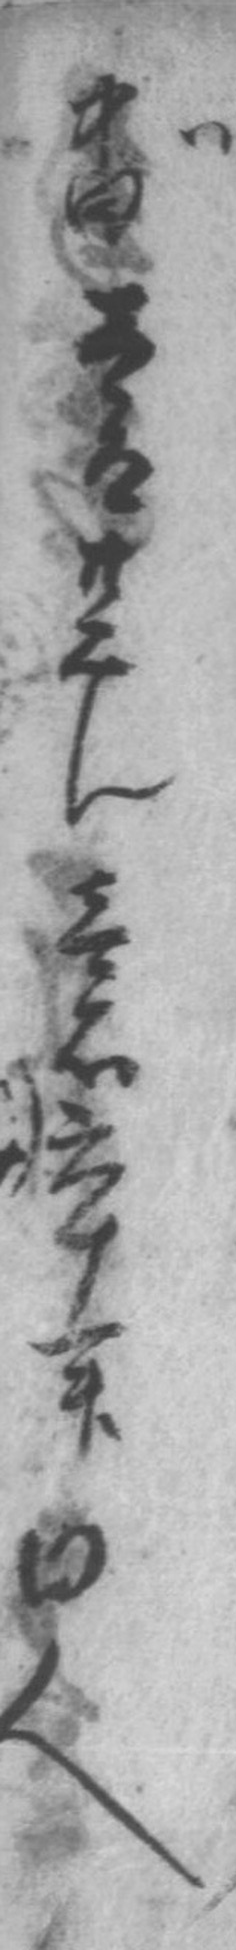中田壱反廿二分壱石六斗一升同人
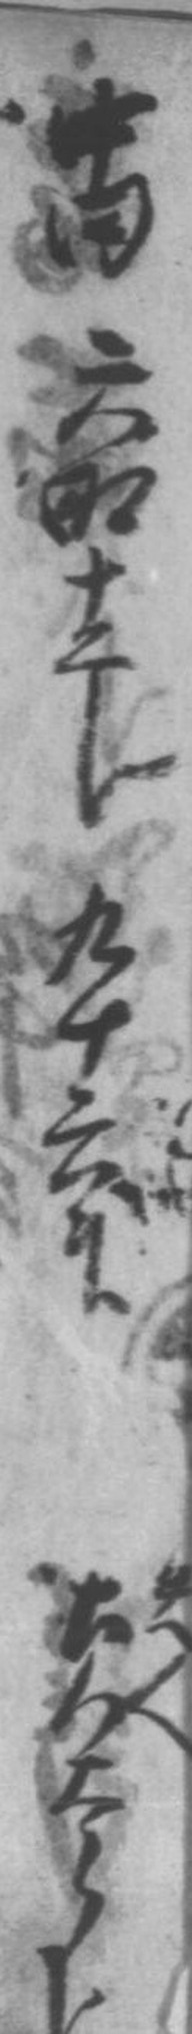中田六畝十二分九斗六升右衛門太郎
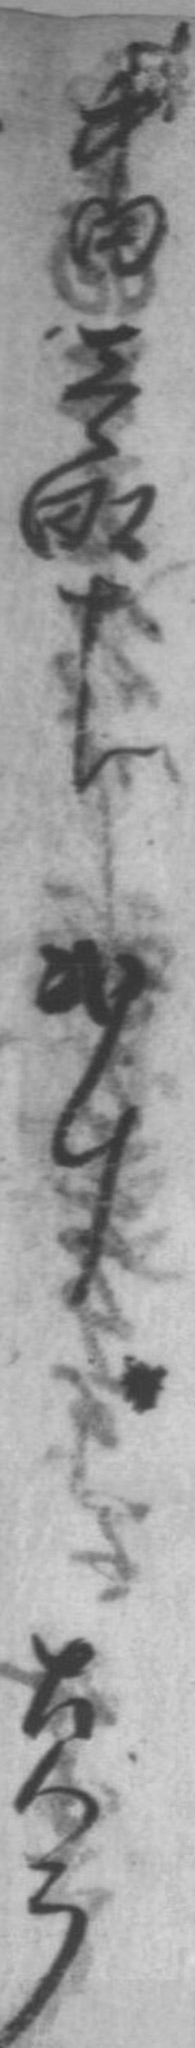中田壱畝十分弐斗右衛門二郎

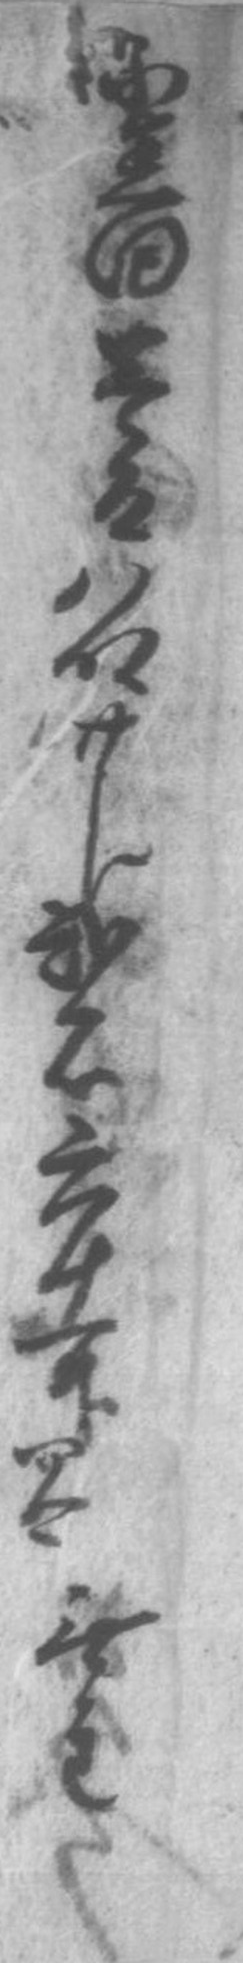当荒田壱反八畝廿分弐石六斗一升四合無主
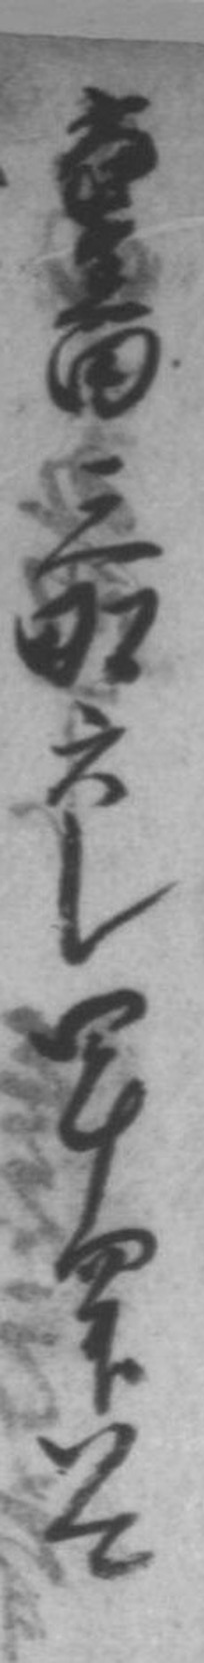当荒田三畝六分四斗四升八合同人

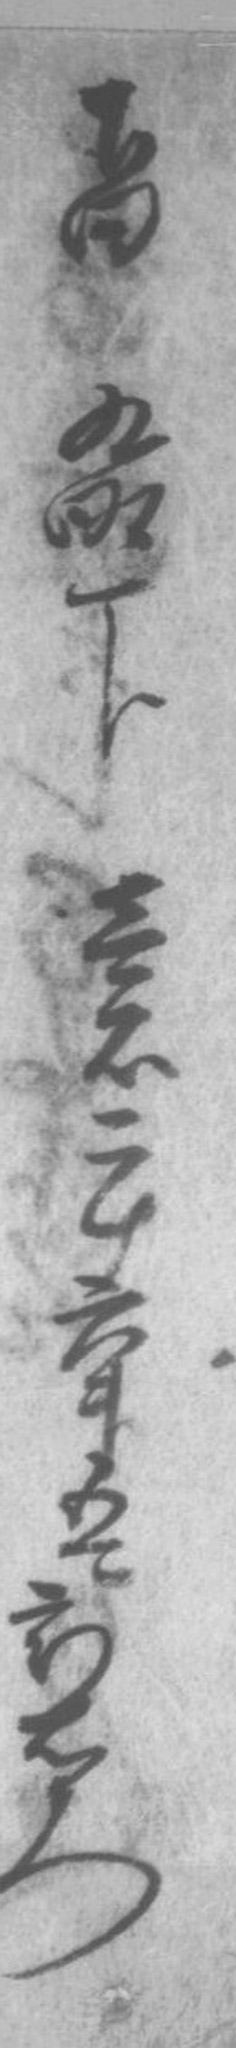下田九畝一分壱石二斗六升五合新右衛門
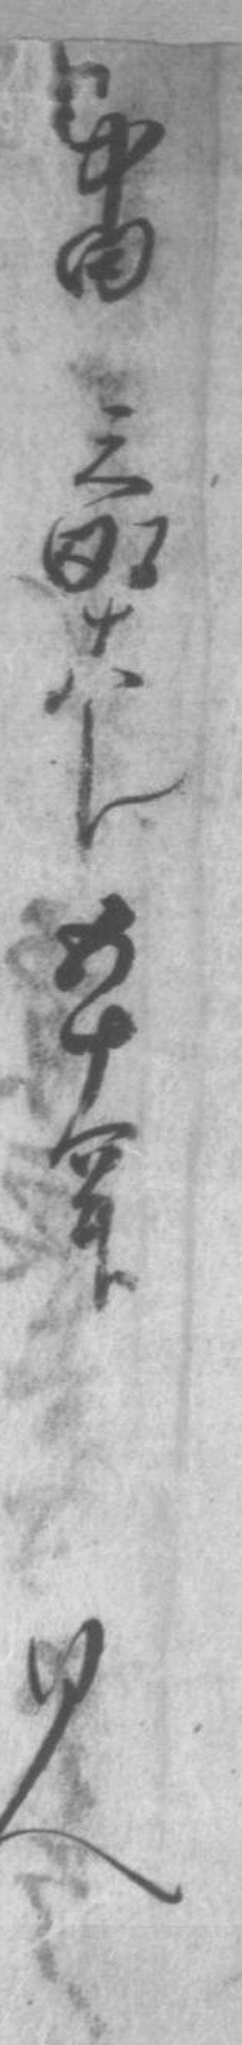中田三畝十八分五斗四升同人
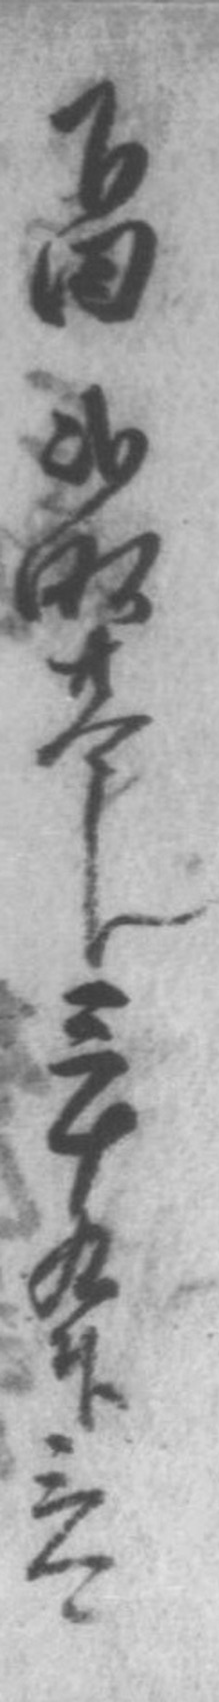下田弐畝廿八分三斗九升三合同人

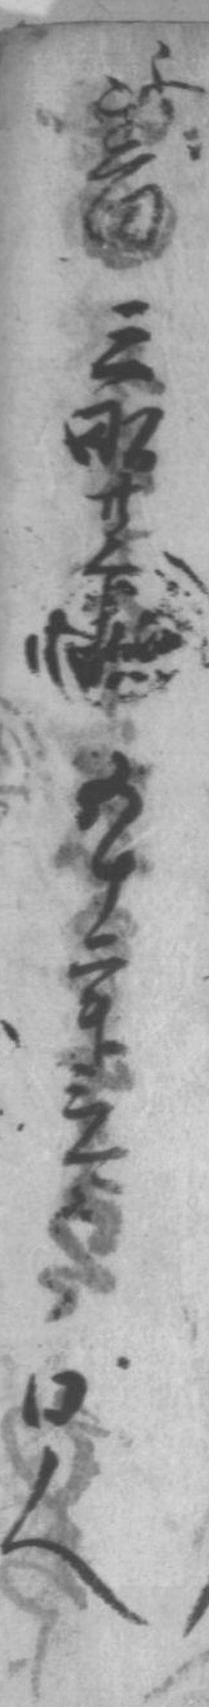当荒田三畝廿二分㊞五斗二升二合同人
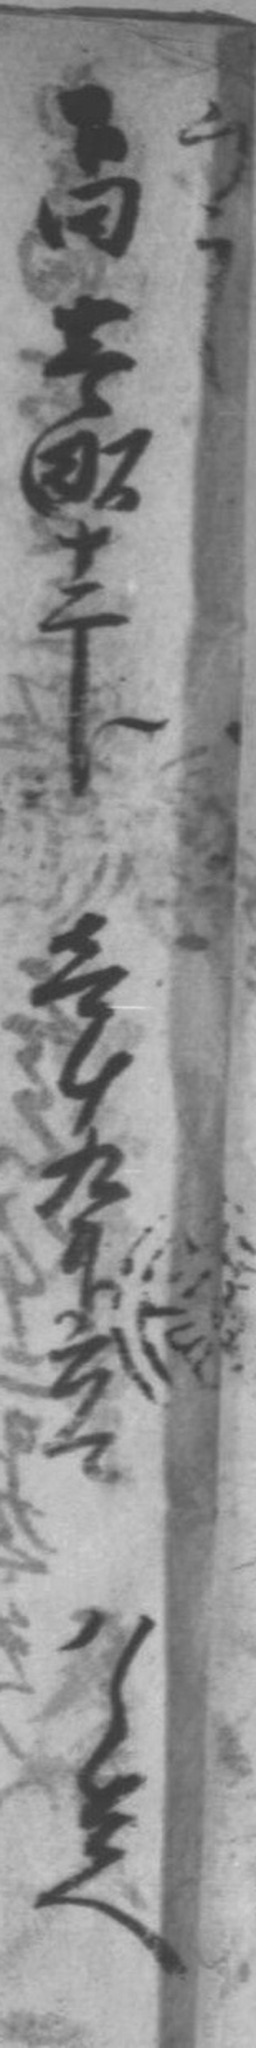下田壱畝十二分壱斗九升六合八郎兵衛
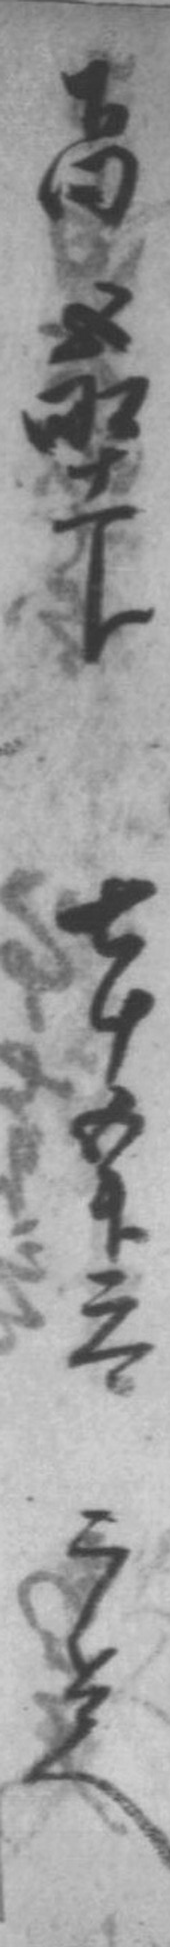下田五畝十一分七斗五升二合二郎兵衛
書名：越州大野郡ノ内不動堂村御検地帳
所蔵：福井県文書館 Fukui Prefectural Archives
